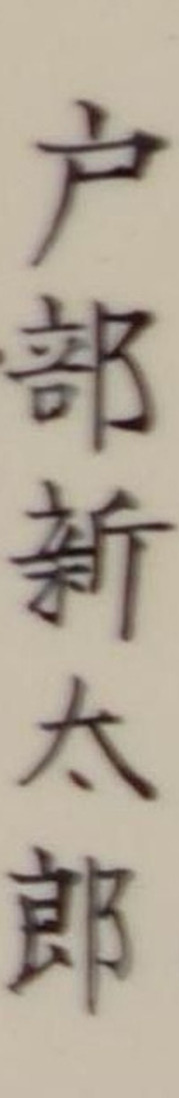戸部新太郎
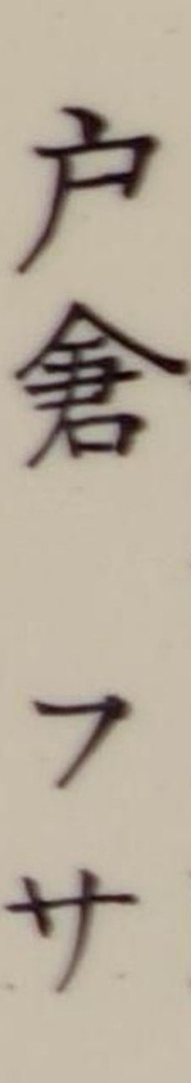戸倉フサ
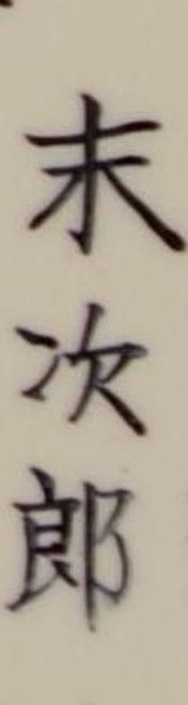末次郎
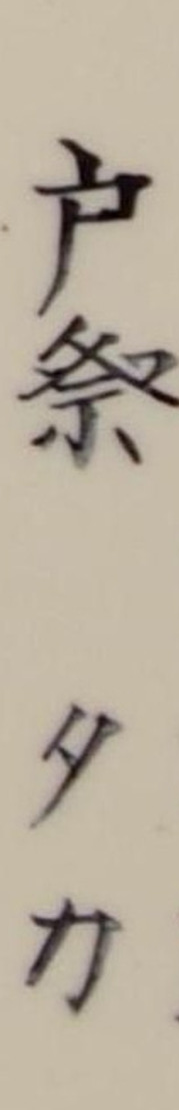戸祭タカ
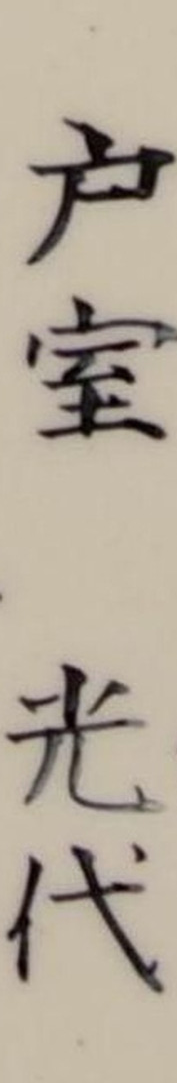戸室光代
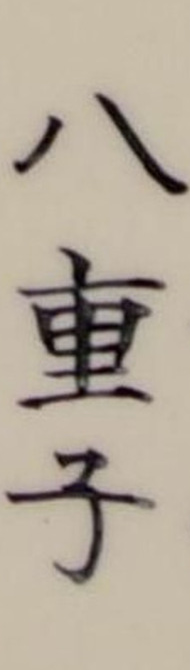八重子
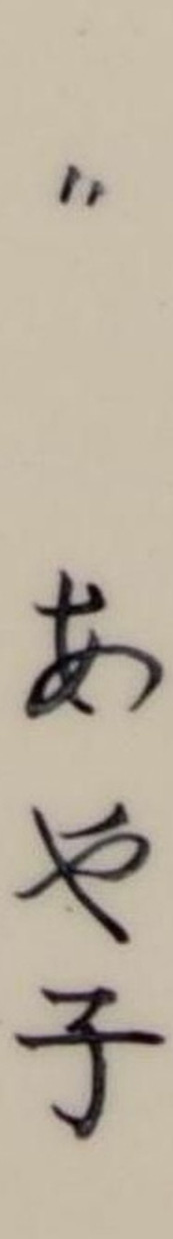あや子
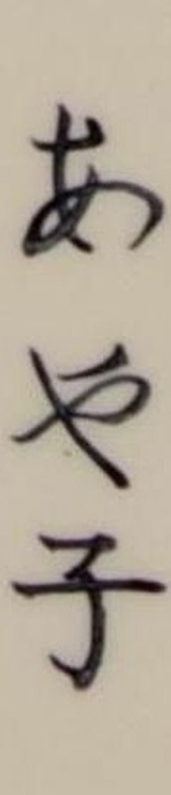あや子
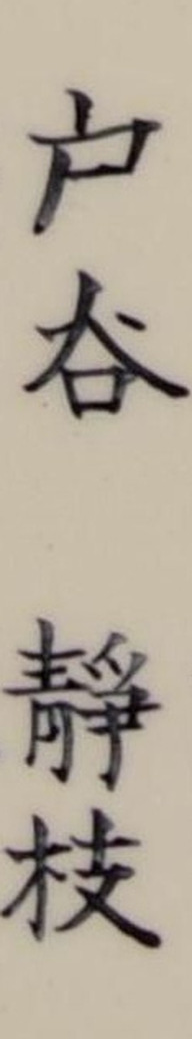戸谷静枝
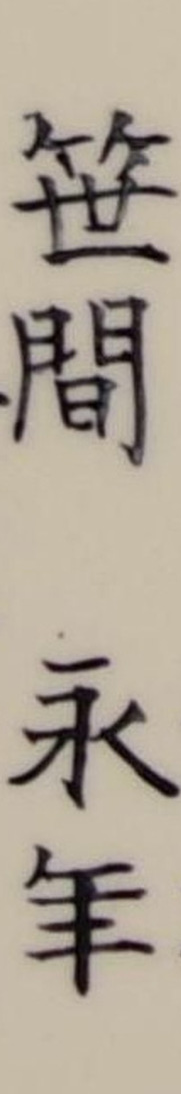笹間永年
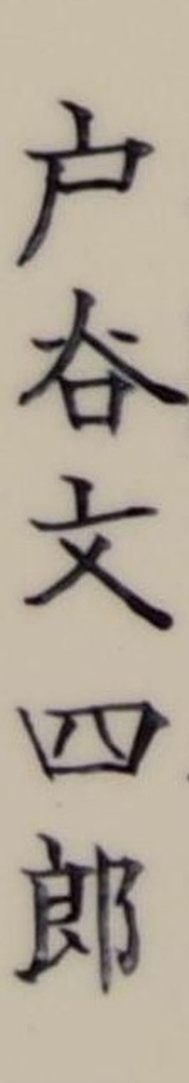戸谷文四郎
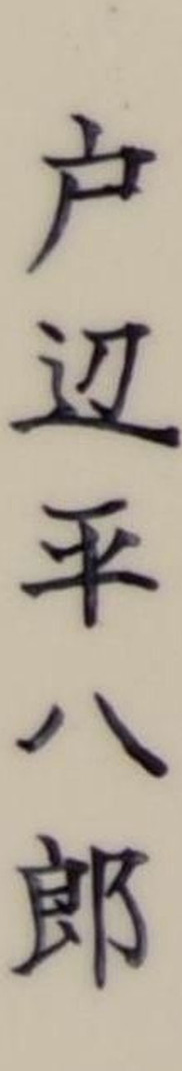戸辺平八郎

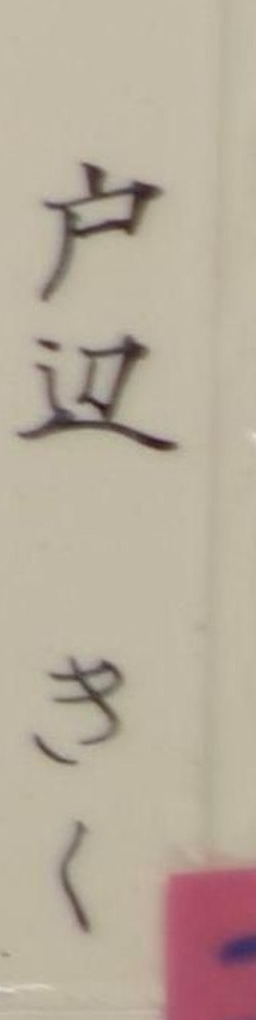戸辺きく
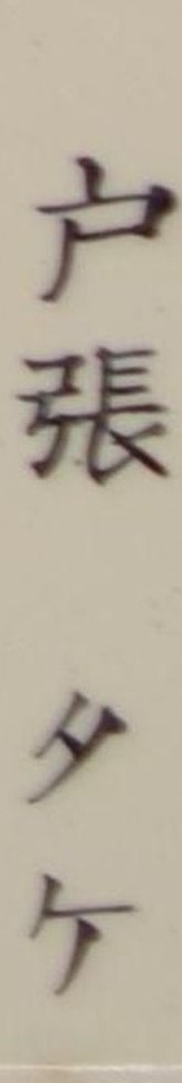戸張タケ
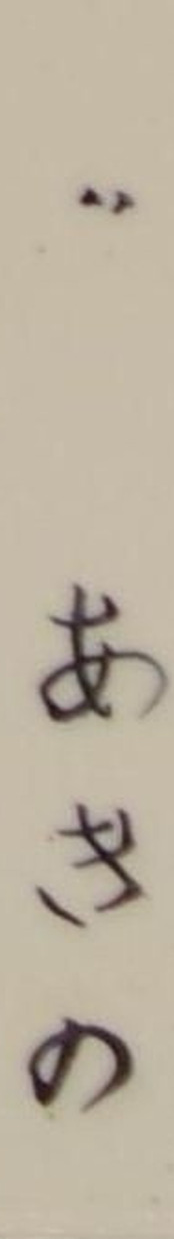あきの
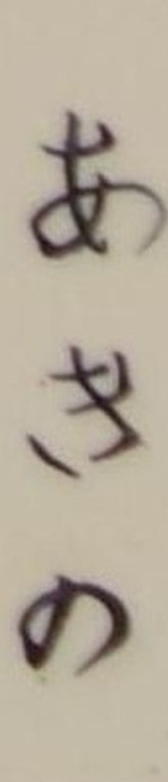あきの
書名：M~S
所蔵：高野山金剛峯寺
